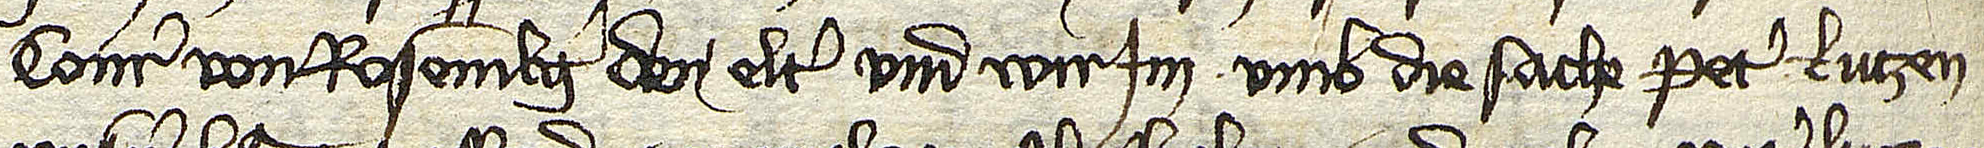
Conr* von Roſemb*g den elt* vnd wir Im . vmb die ſache Pet* Lucʒen
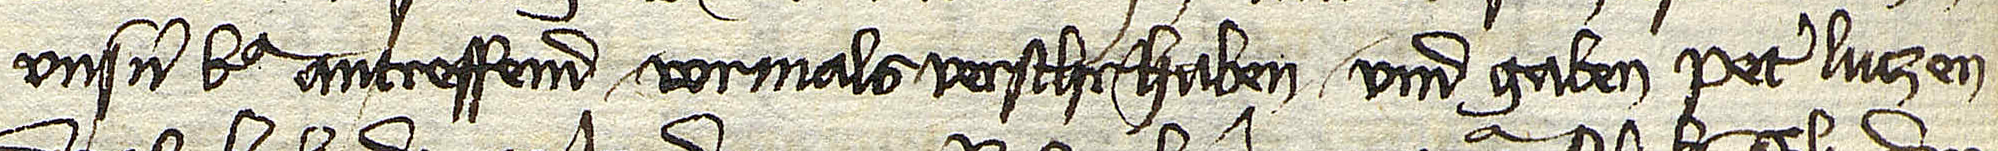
vnſ*n b* antreffend / vormals verſchr* haben / vnd gaben Pet* lucʒen
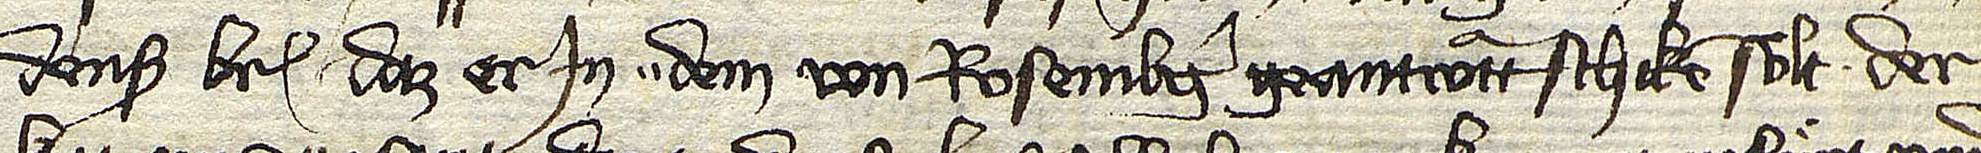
denſ* br* / daʒ er In ~ dem von Roſemb*g geantw*tt ſchike* ſölt . der
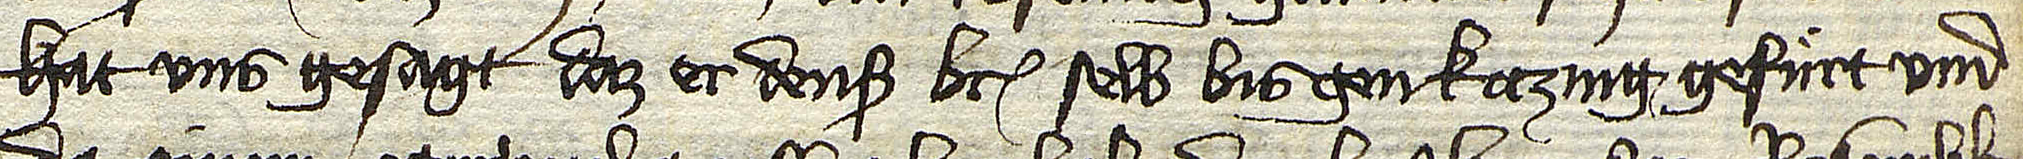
hat vns geſagt daʒ er denſ* br* ſelb bis gen kicʒnig gefürt vnd
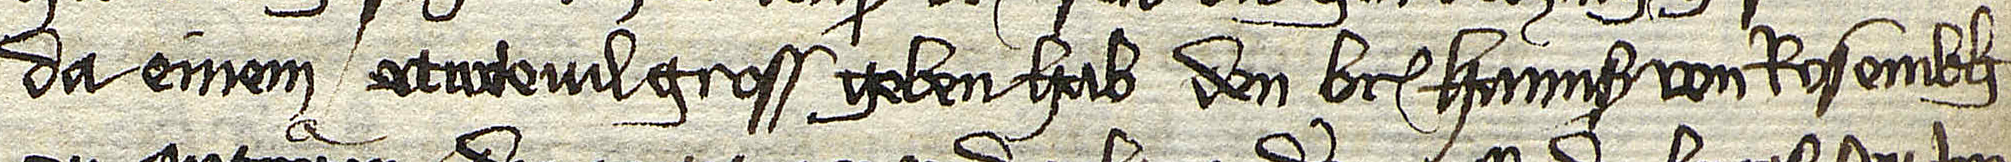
da einem etwieuil groſſ geben hab den br* hannſ* von Roſemb*g
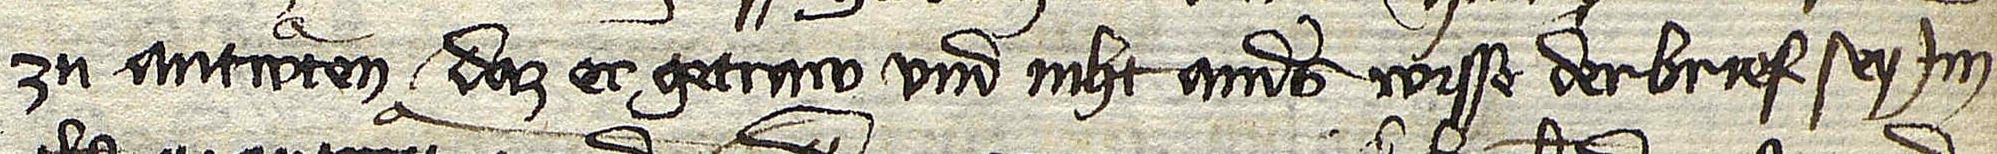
ʒu antw*ten / daʒ er getraw vnd niht and*s wiſſe der brief ſey Im
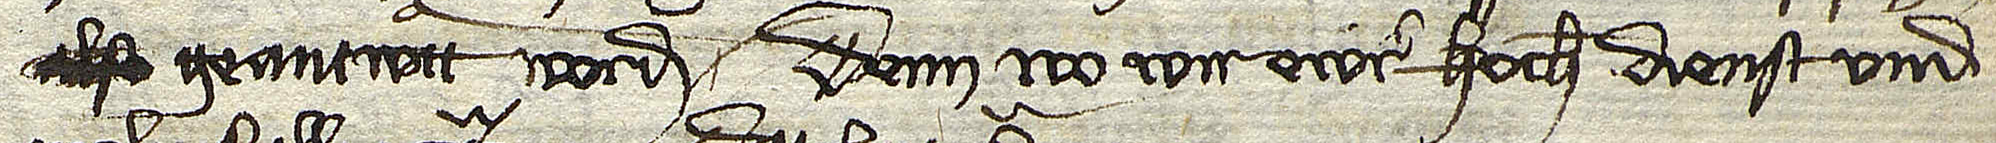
alſo geantw*tt word* / Denn wo wir ew*r hoch* dienſt vnd
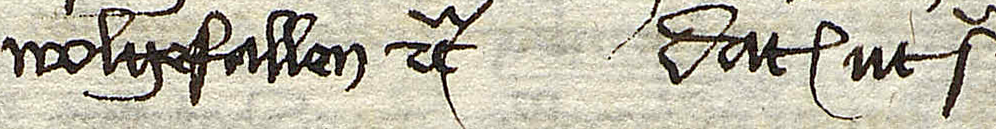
wolgefallen ec* / Dat* ut ſ*
